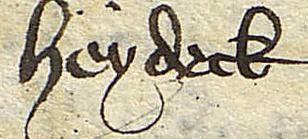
heydeck
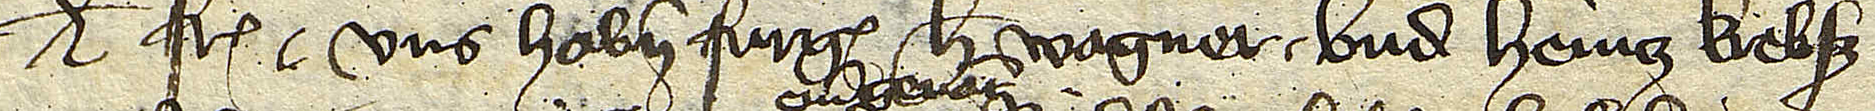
L* fr* / vns habn* fürg* h* wagner / vnd heincʒ krebſʒ
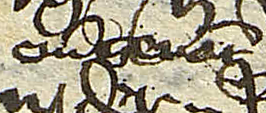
ein* genat*
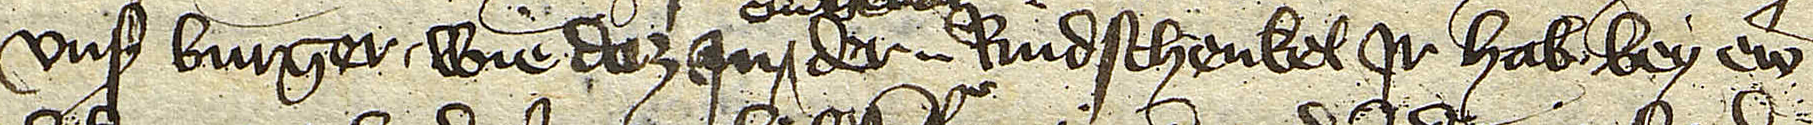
vnſ* burger / wie daʒ In der ~ Rindſchenkel Ir hab bey ew
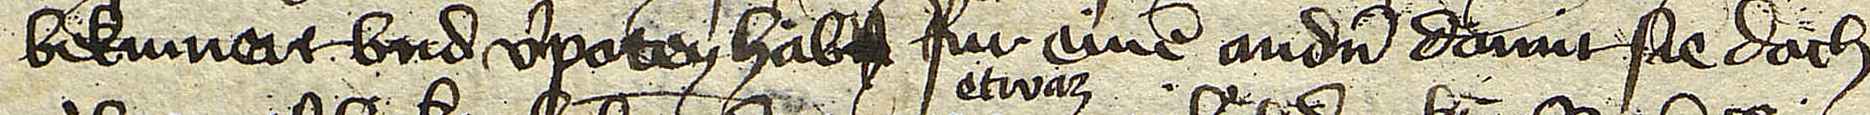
bekumert vnd v*poten habn* für eine* andn* damit ſie doch
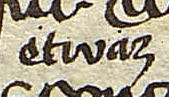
etwaʒ
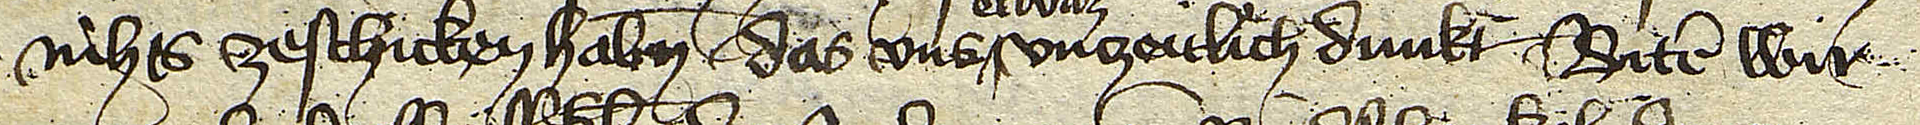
nihts cʒeſchicken habn* / das vns vncʒeitlich dunkt / Bite* wir
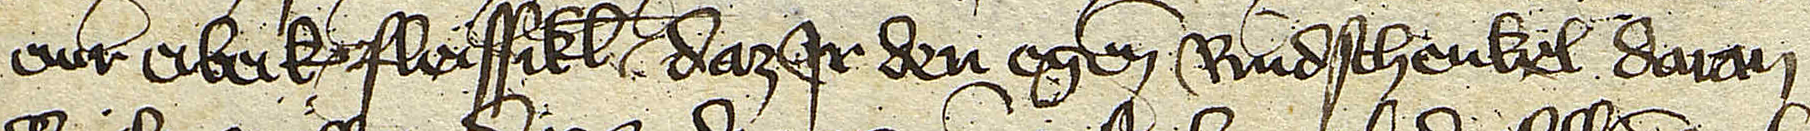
ewr erberk* fleiſſikl* / daʒ Ir den egen* Rindſchenkel daran
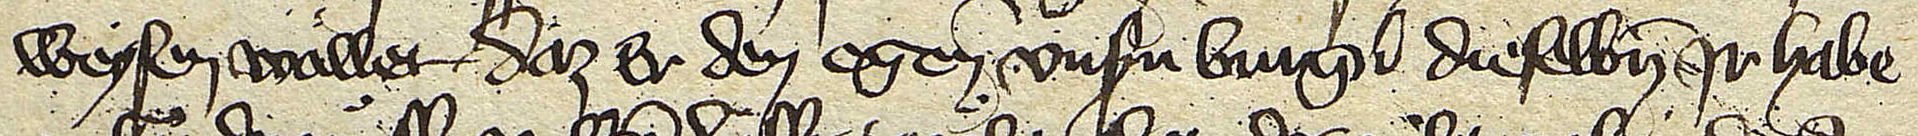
weyſen wöllet / daʒ Er den egen* vnſ*n burgn* dieſelbn* Ir habe
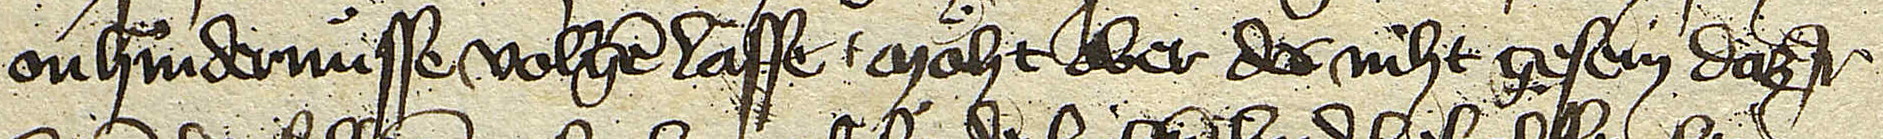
onhindernüſſe volge* laſſe / Möht aber des niht geſein daʒ Ir
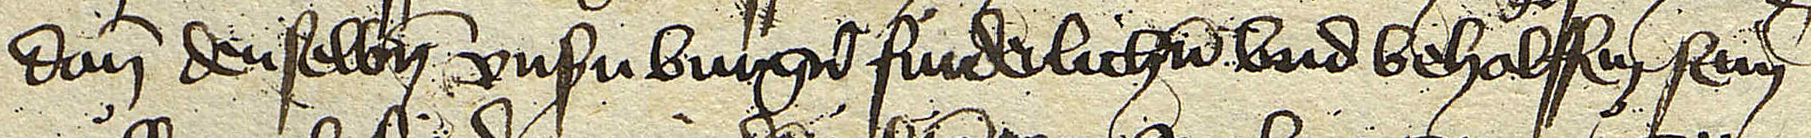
dan* denſelbn* vnſ*n burgn* fürderlichn* vnd beholffen ſein
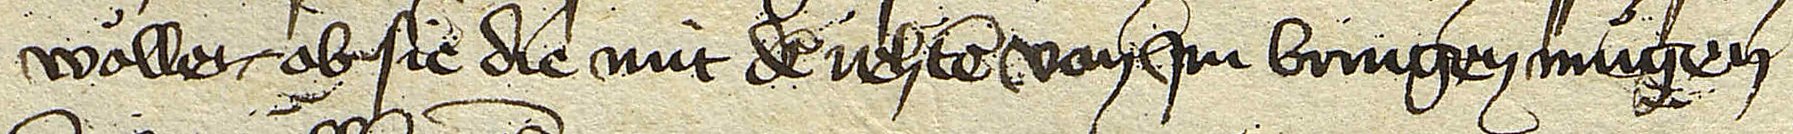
wöllet / ob ſie die mit d* rehte* von Im bringen mügen
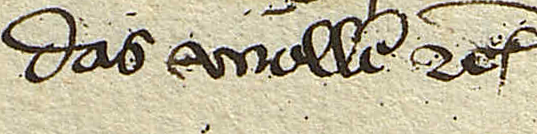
das wölle* ec*
